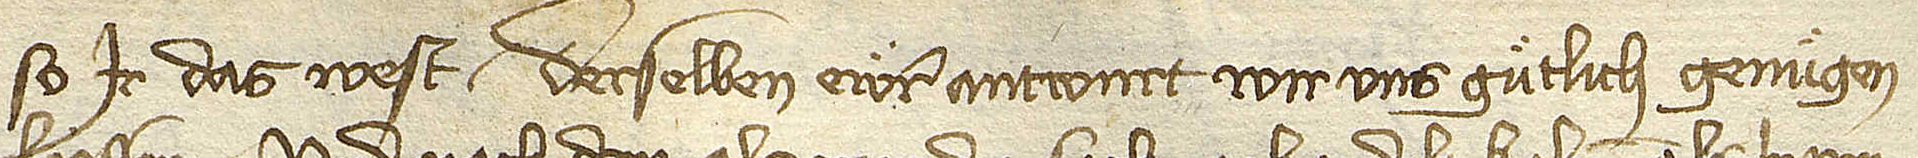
ſo Ir das weſt / Derſelben ew*r antwurt wir vns gütlich genügen
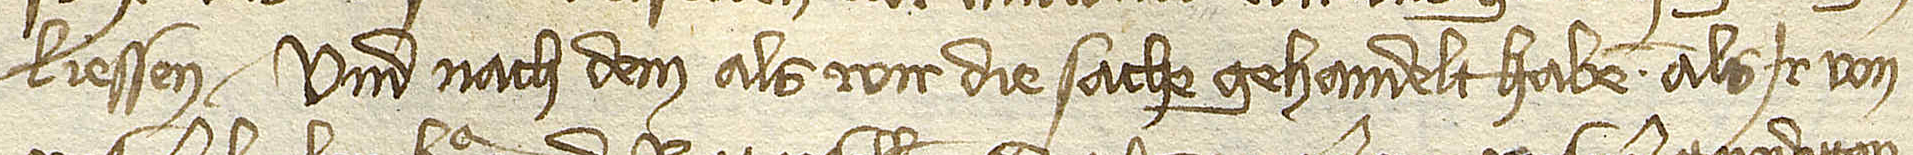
lieſſen / Vnd nach dem als wir die ſache gehandelt habe* . als Ir von
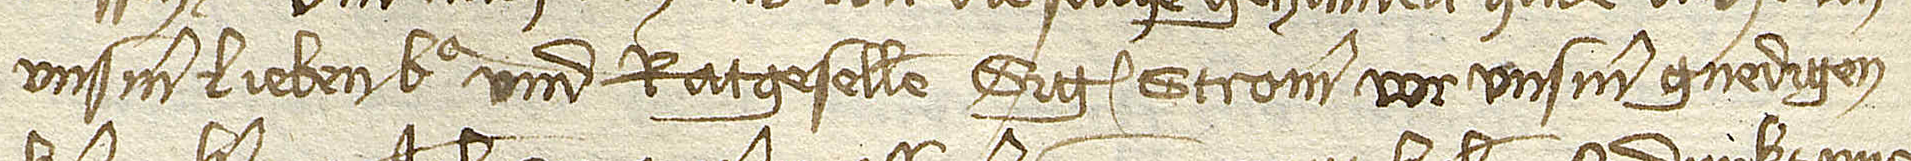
vnſ*m lieben b* vnd Ratgeſelle* Sig* Strom* vor vnſ*m gnedigen
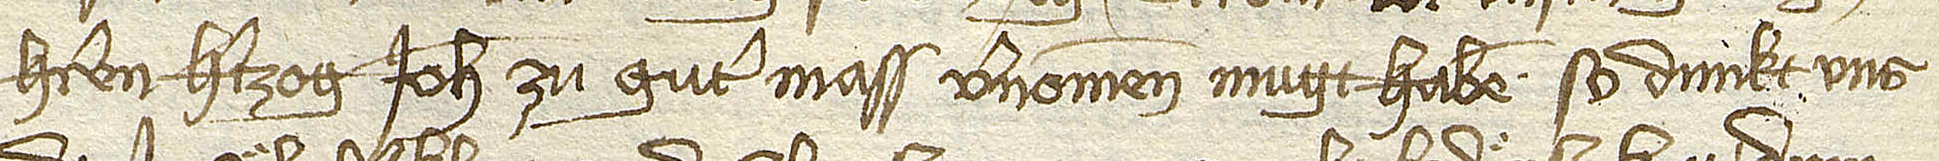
h*ren h*cʒog Ioh* ʒu gut* maſſ v*nomen* mugt habe* . ſo dunkt vns
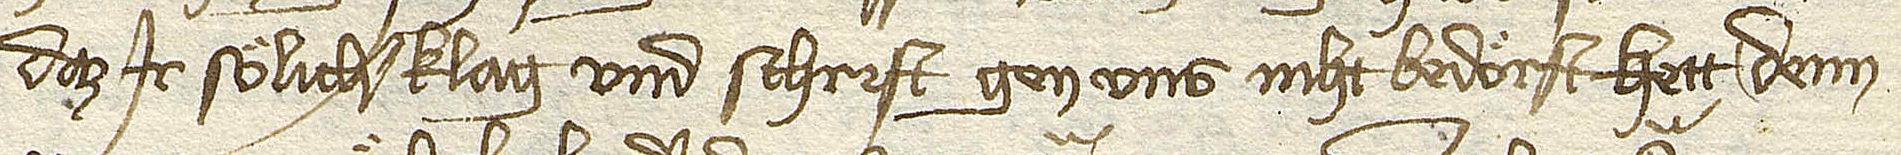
daʒ Ir ſölich* klag vnd ſchrift gen vns niht bedörft hett / denn
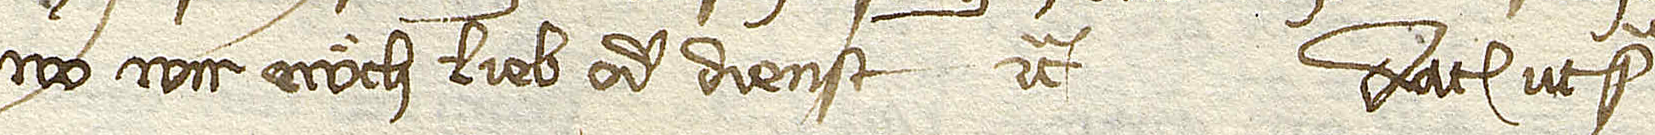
wo wir ewch lieb od* dienſt ec* Dat* ut ſ*
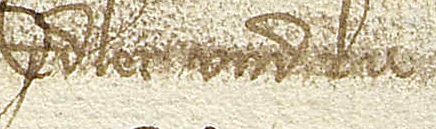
Edler vnd lie
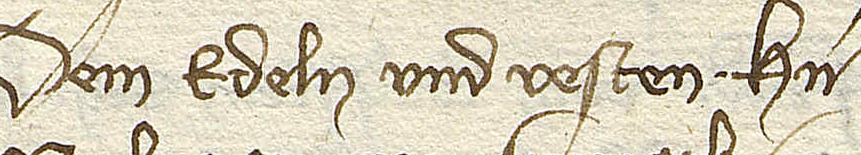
Dem Edeln vnd veſten H*n
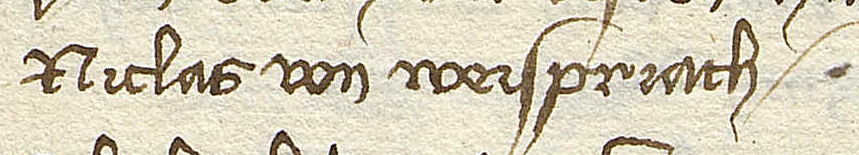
Niclas von weiſpriach
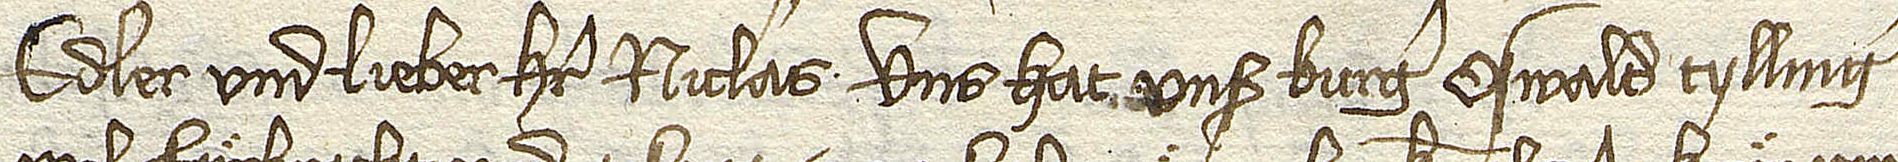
Edler vnd lieber H*r Niclas . Vns hat vnſ* burg* Oſwald tylling*
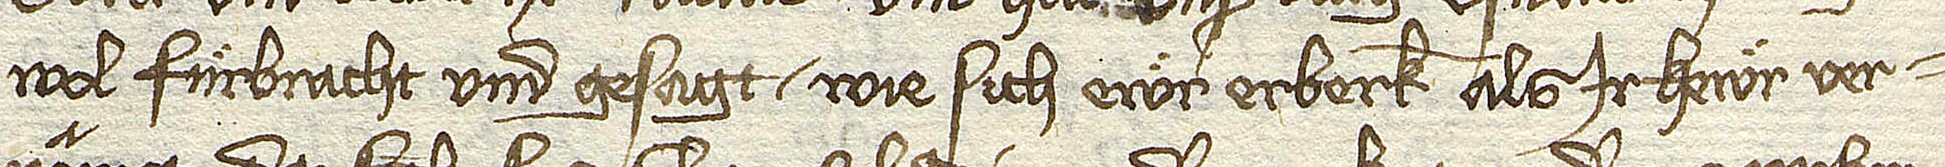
wol fürbracht vnd geſagt / wie ſich ewr erberk* als Ir hewr ver =
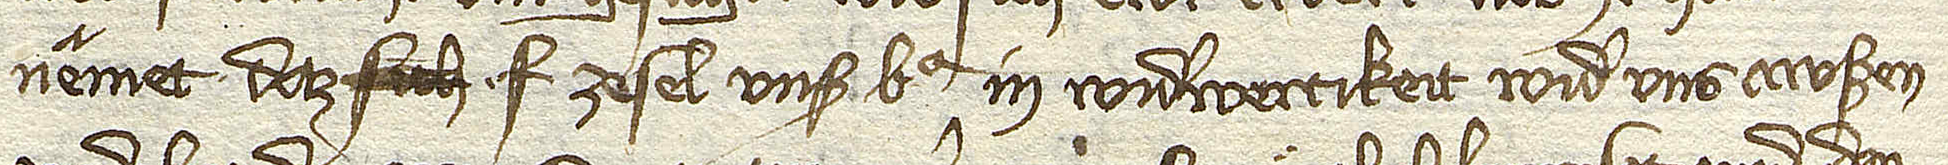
nëmet . daʒ ſich . f ʒeſel vnſ* b* in wid*wertikeit wid* vns awſʒen
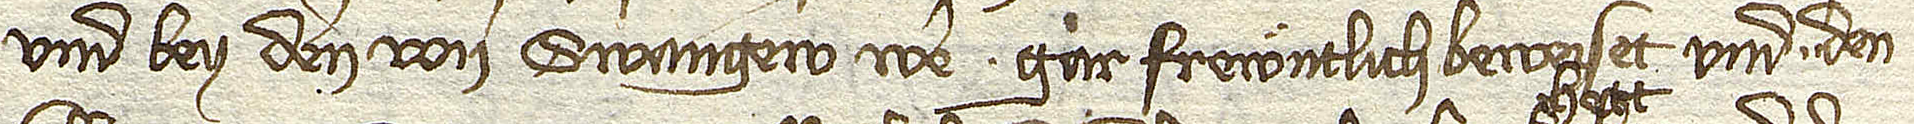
vnd bey den von Swangew w*e . gar frewntlich beweiſet vnd ~ den
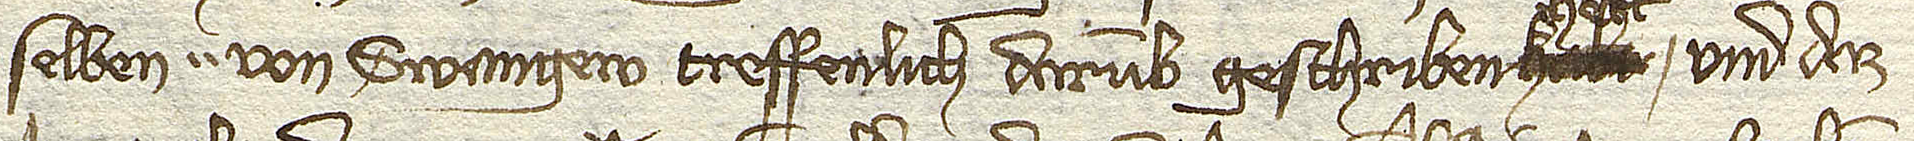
ſelben ~ von Swangew treffenlich darub* geſchriben habt / vnd daʒ
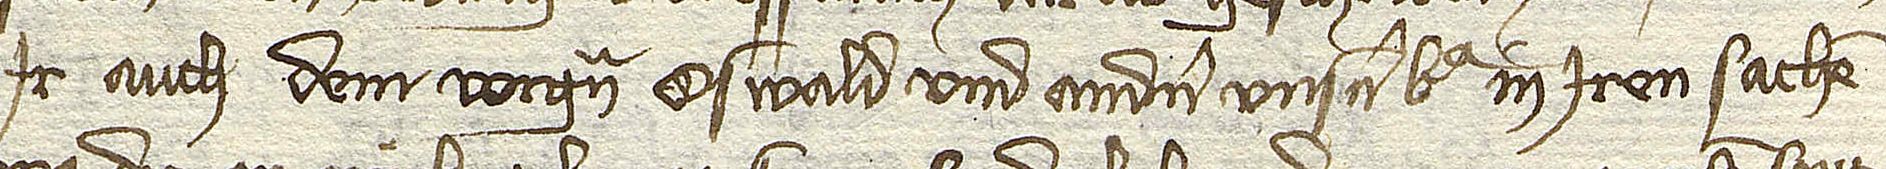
Ir auch dem vorgn* Oſwald vnd and*n vnſ*n b* in Iren ſache*
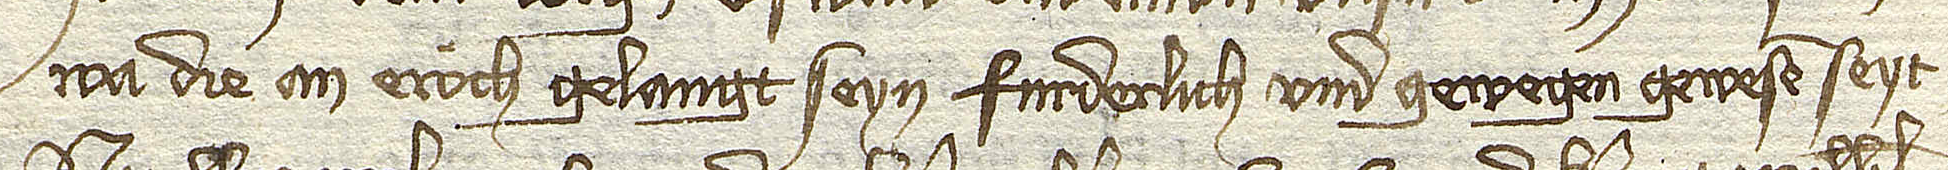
wo die an ewch gelangt ſeyn furderlich vnd gewegen geweſe* ſeyt
